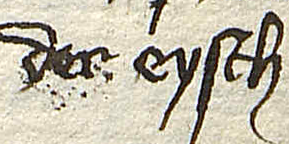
der eyſch
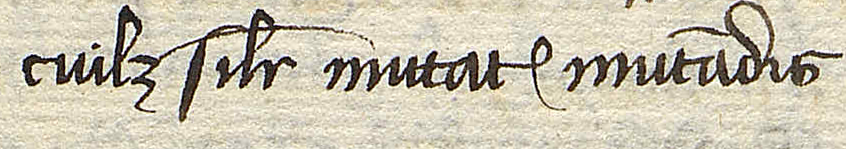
cuil* ſilr* mutat* muta*dis
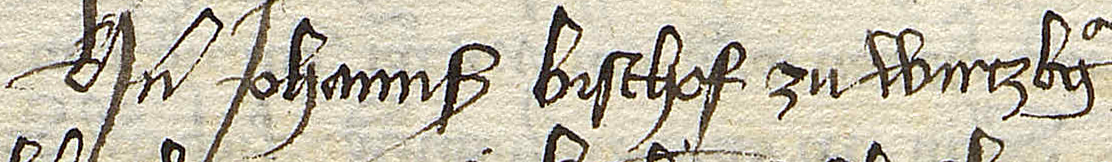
Hn* Iohannſ* biſchof ʒu Wircʒb*g
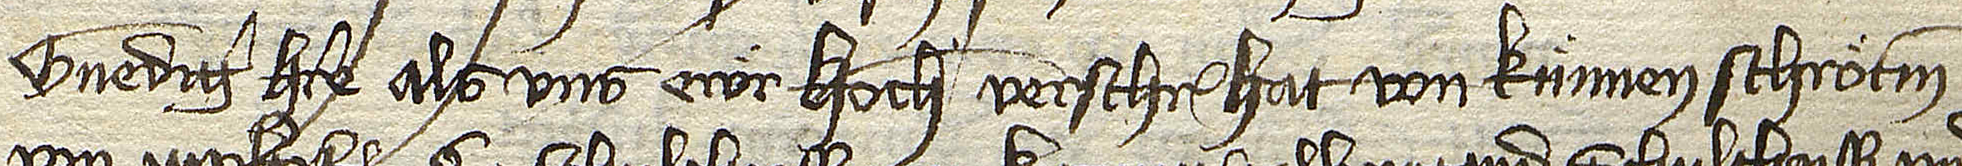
Gnedig* h*re als vns eẅr hoch* verſchr* hat von künnen ſchrötin*
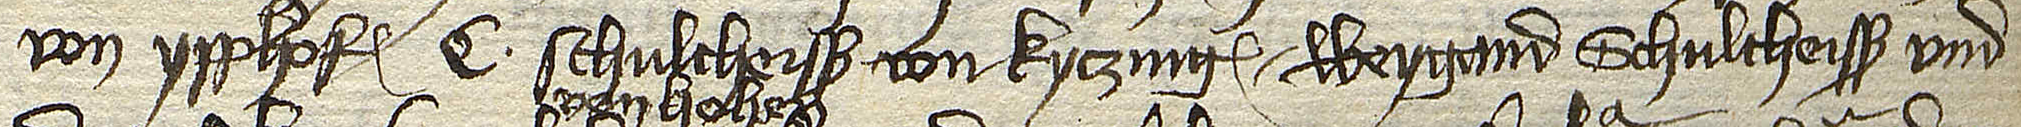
von ypphof* C* ſchultheiſſ* von kycʒing* / Weygand Schultheiſſ* vnd
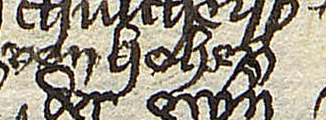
von hohen
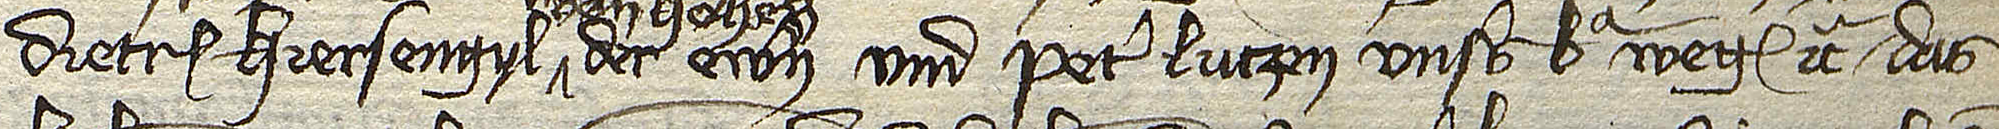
Dietr* hierſengyl der eẅ*n vnd Pet* lucʒen vnſ*s b* weg* ec* / das
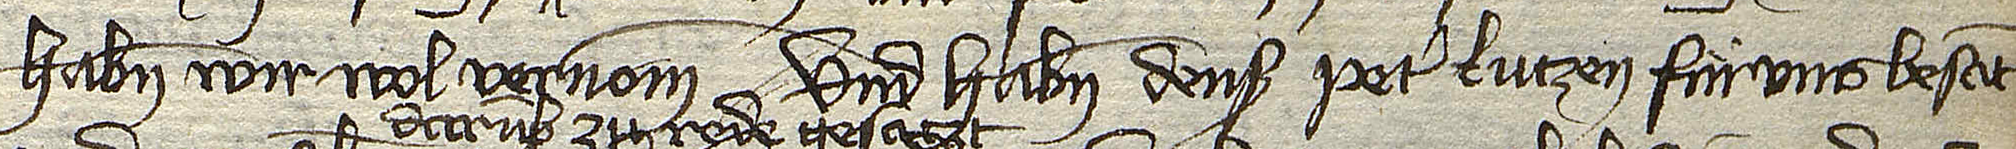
habn* wir wol vernom* / Vnd habn* denſ* pet* lucʒen für vns beſat*
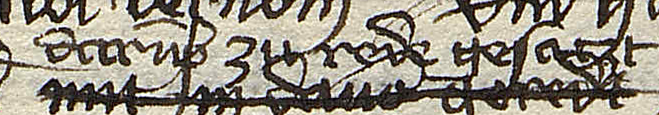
darub* ʒu rede geſacʒt
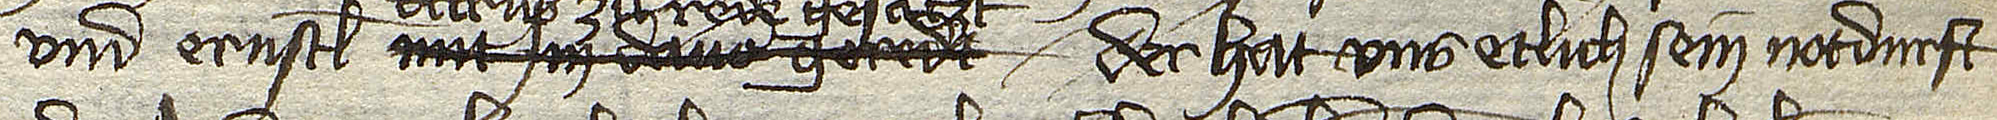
vnd ernſtl* mit Im dauo* geredt / Der hat vns etlich ſein notdurft
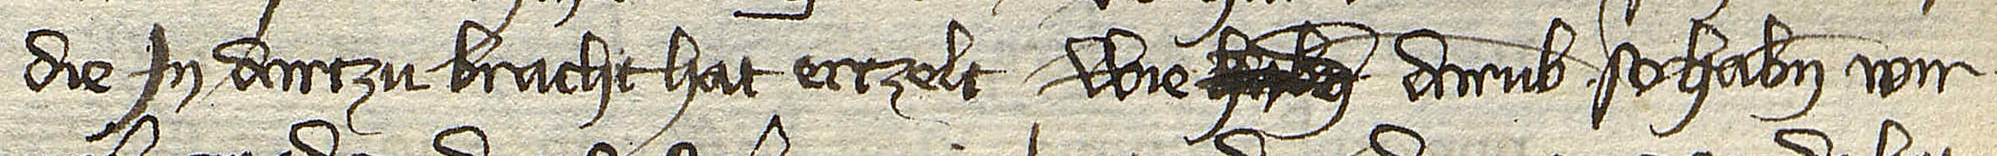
die In darcʒu bracht hat ercʒelt / wie habn* darub* ſo habn* wir
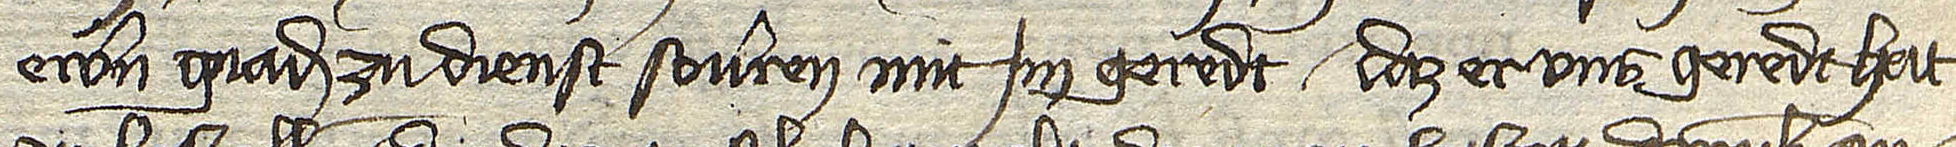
eẅ*n gnad* ʒu dienſt ſou*ren mit Im geredt / daʒ er vns geredt hat
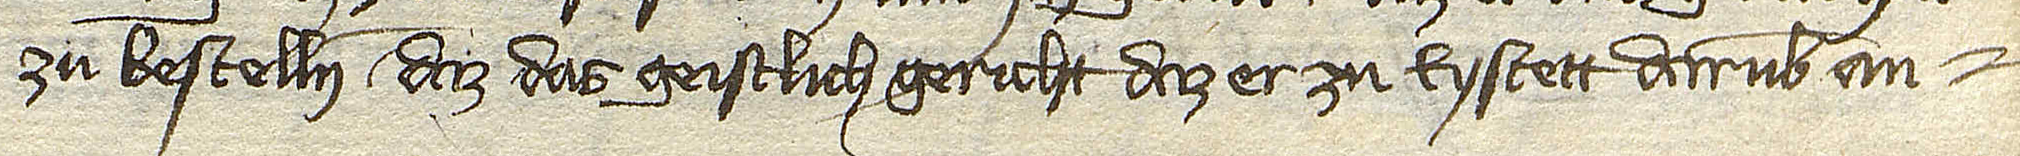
ʒu beſtelln* / daʒ das geiſtlich gericht daʒ er ʒu Eyſtett darub* an =
